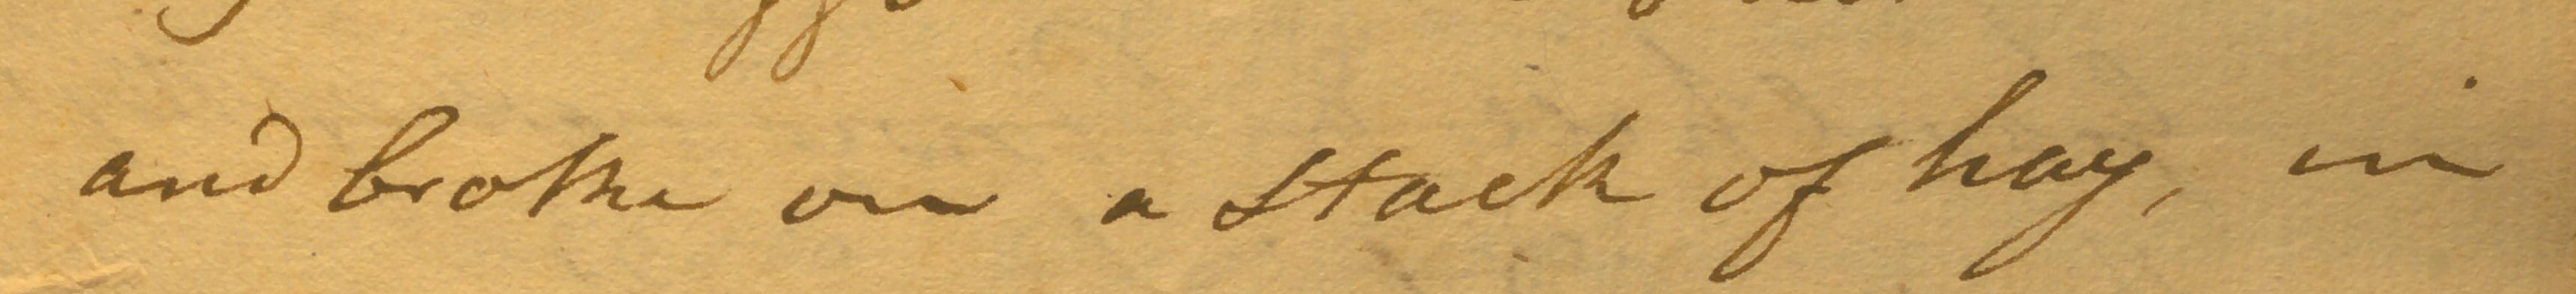and broke on a Stack of hay, in
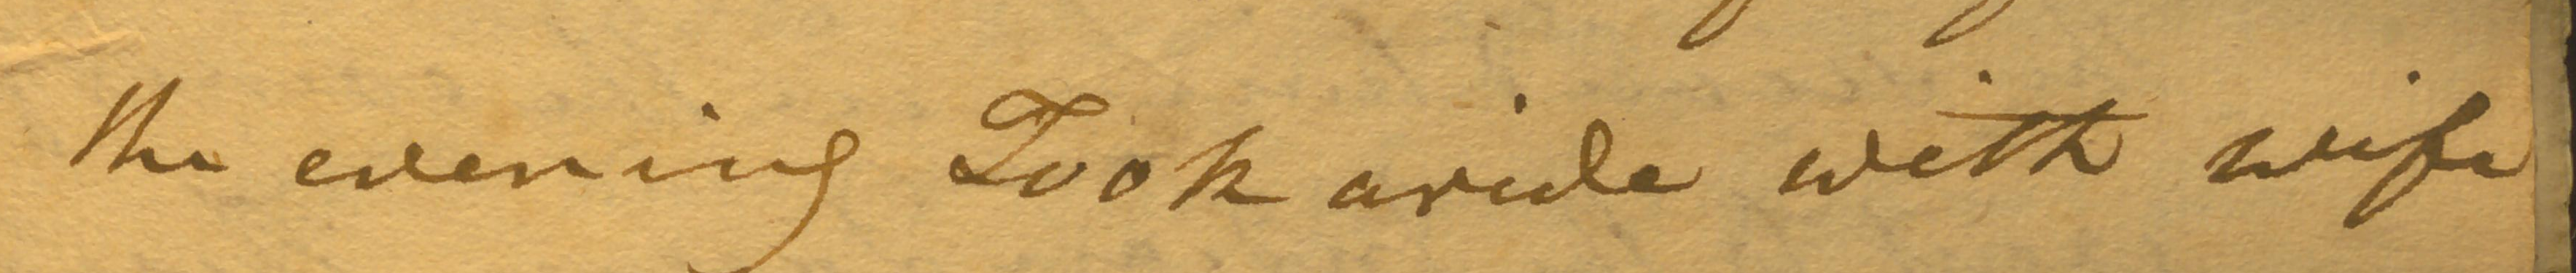the evening Took a ride with wife
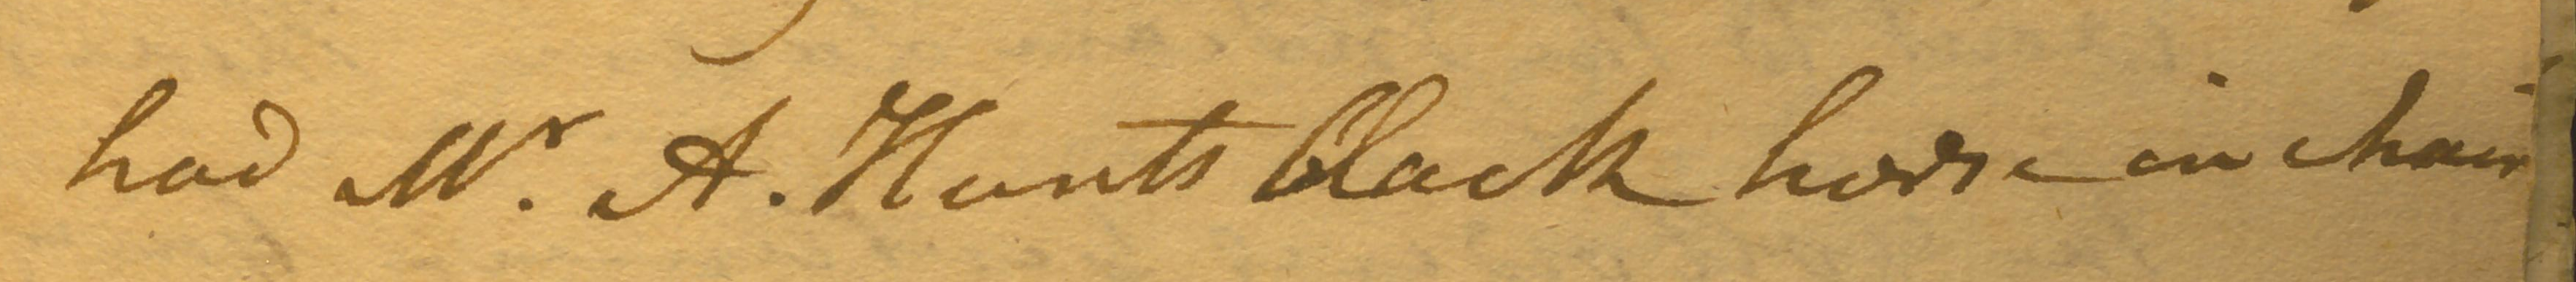had M^r. A. Hunts black horse in chair
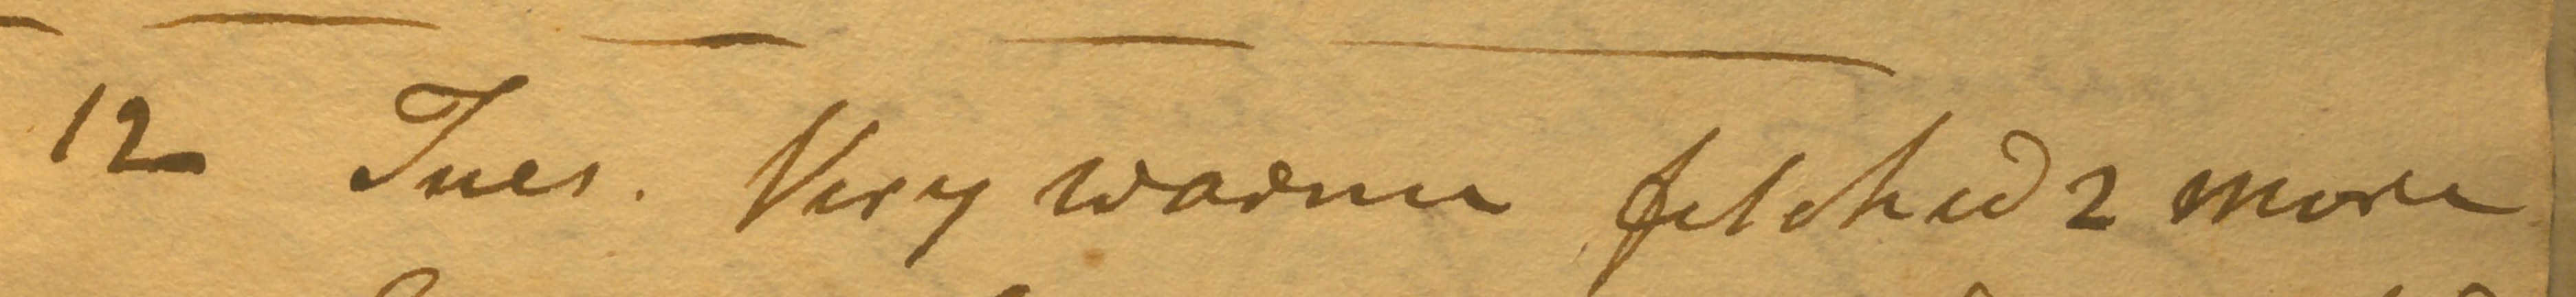12 Tues. Very warme fetched 2 more
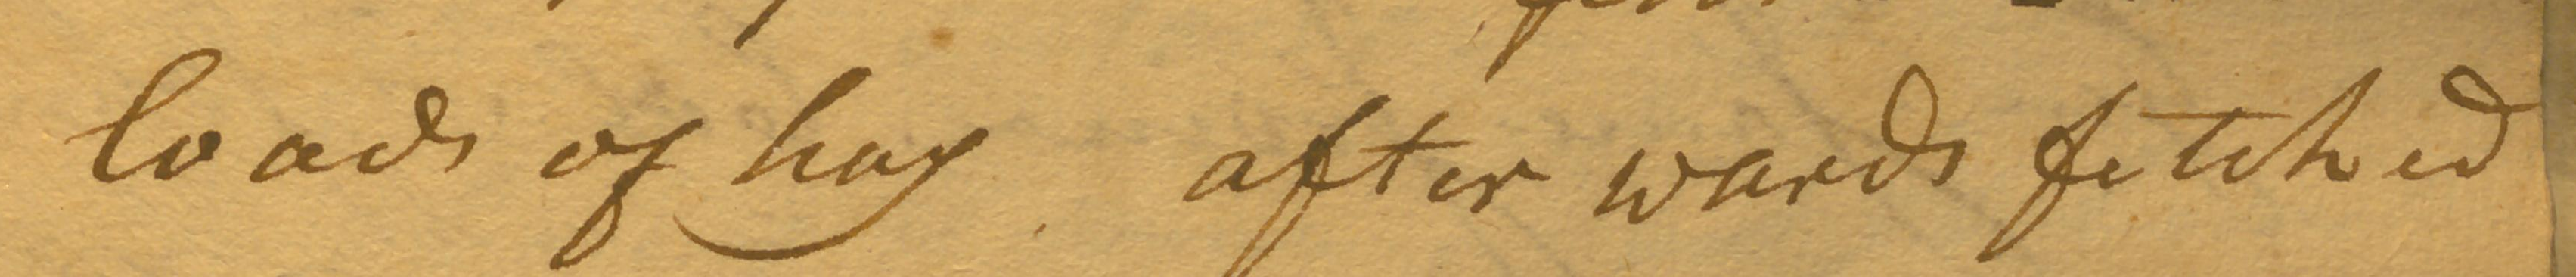loads of hay after wards fetched
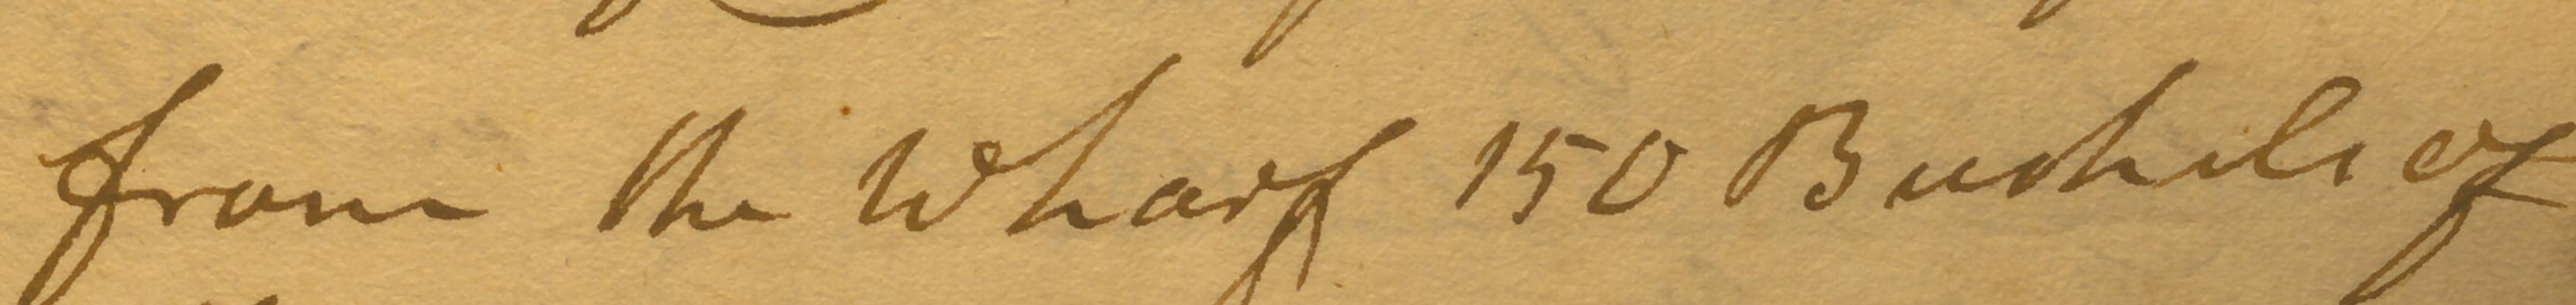from the Wharf 150 Bushels of
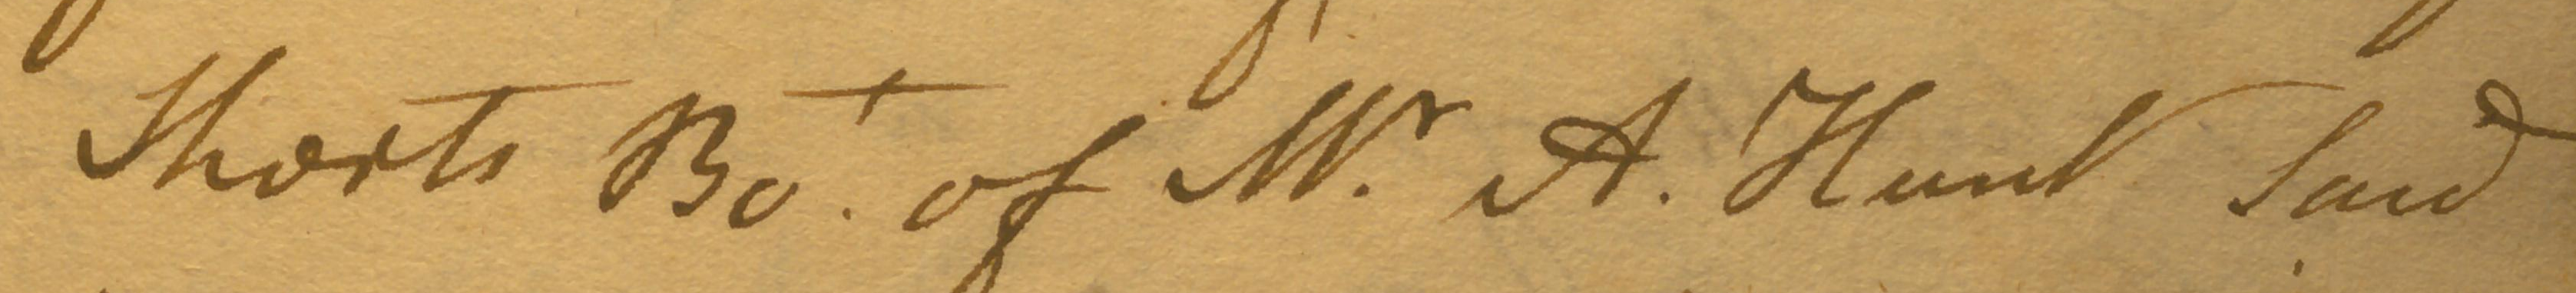Shorts Bo^t. of M^r. A. Hunt Said
